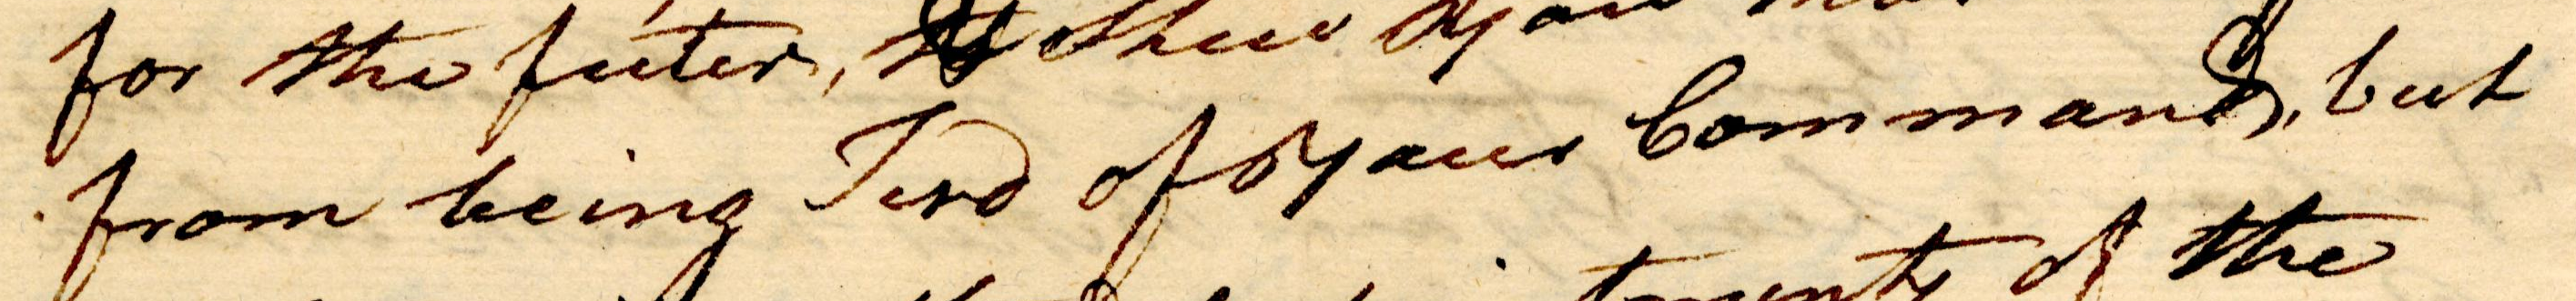from being Tird of your Command, but
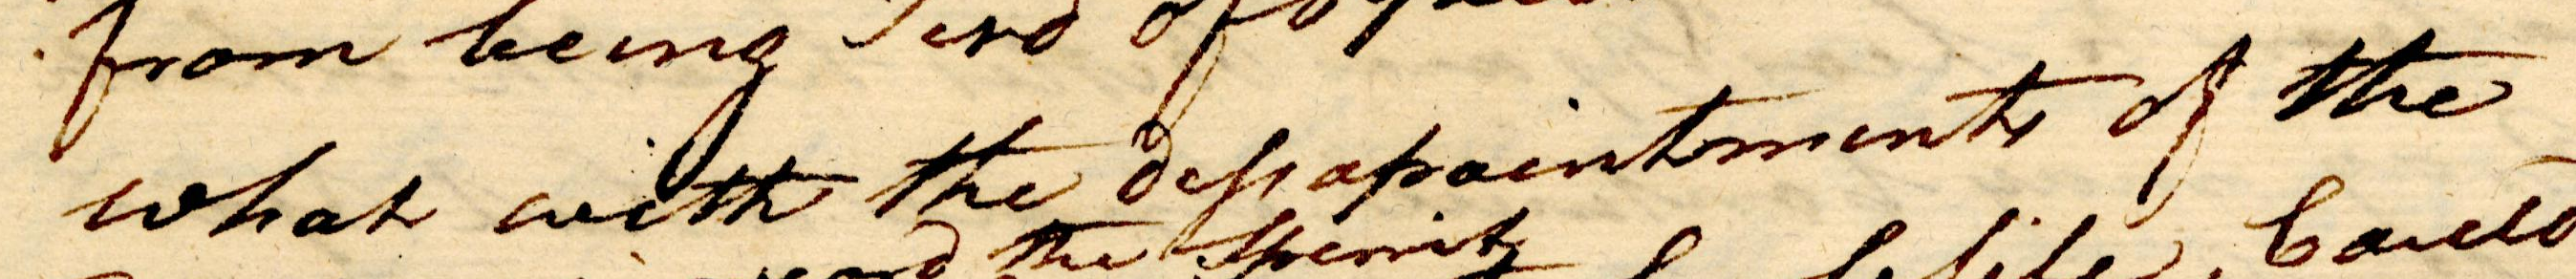what with the dessappointment of the
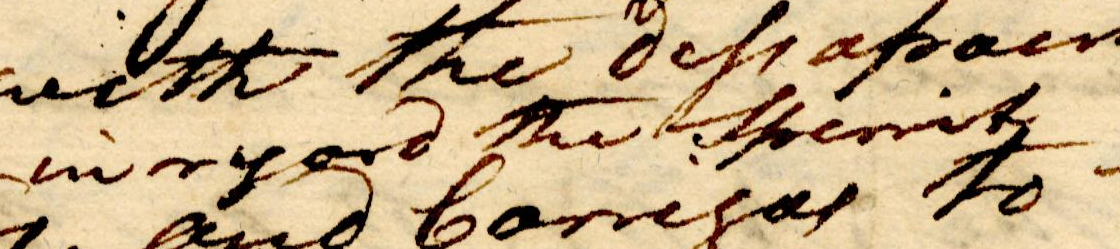in regard the spirit
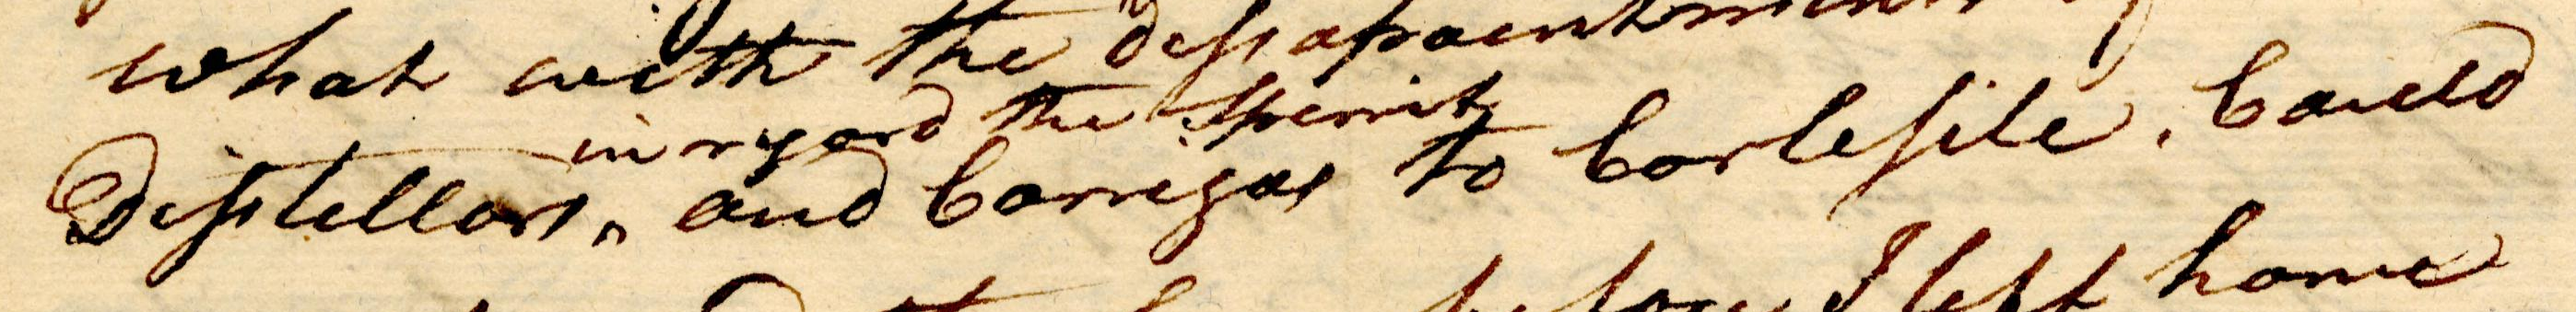Distellers, and Carriges to to Corlesile, Could
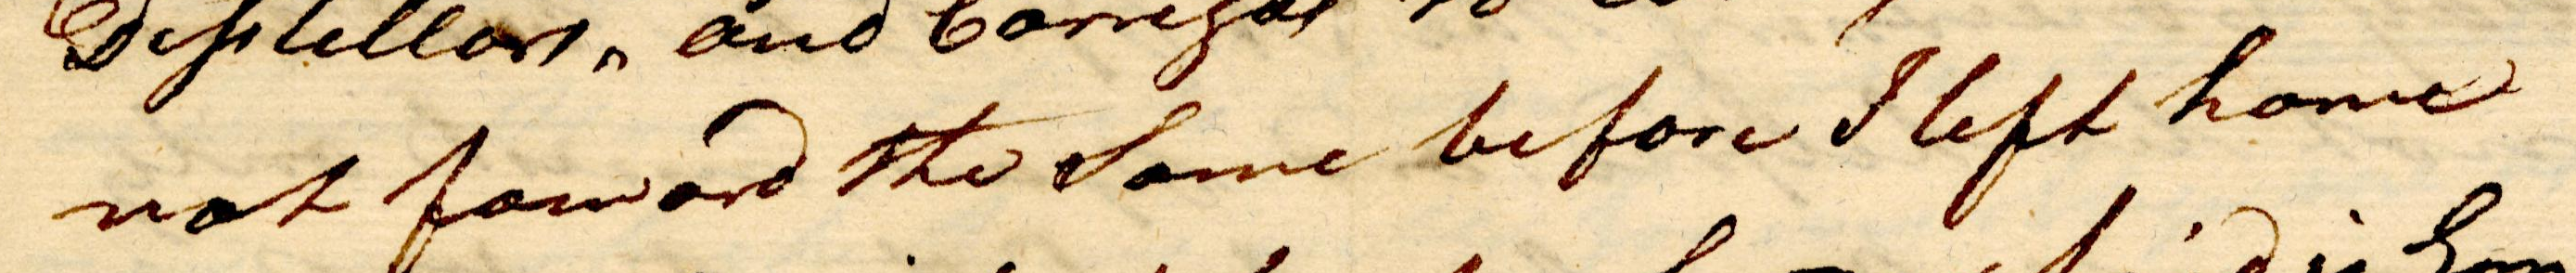not forward the Same before I left home
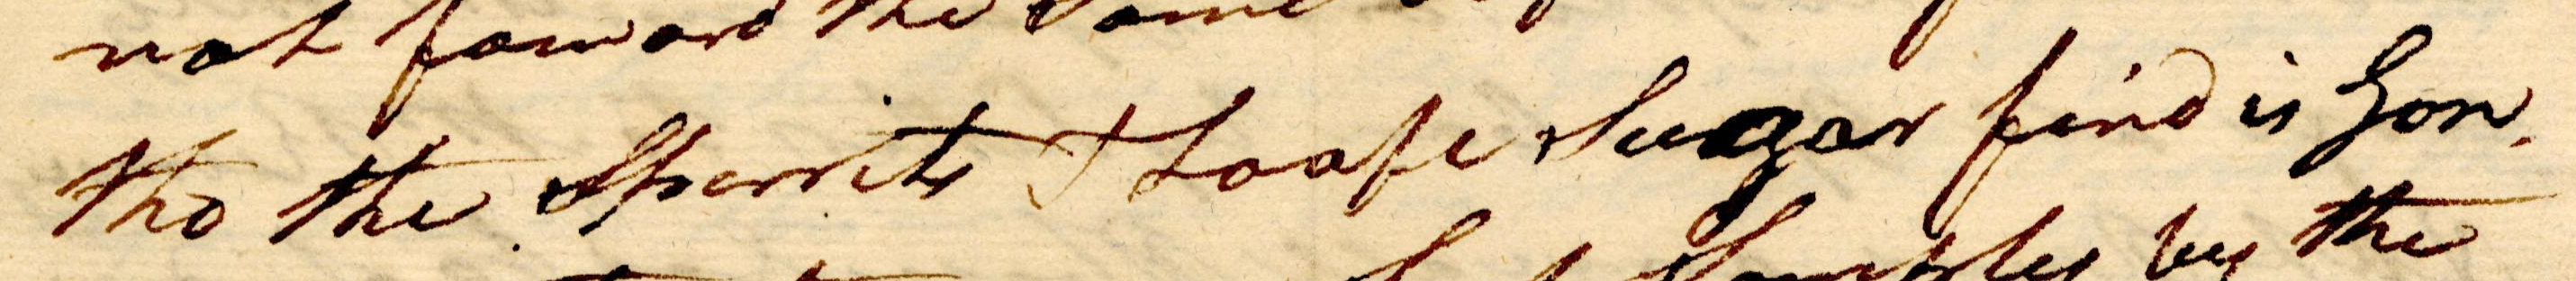tho the Sperrits & Loafe Sugar find is Gon
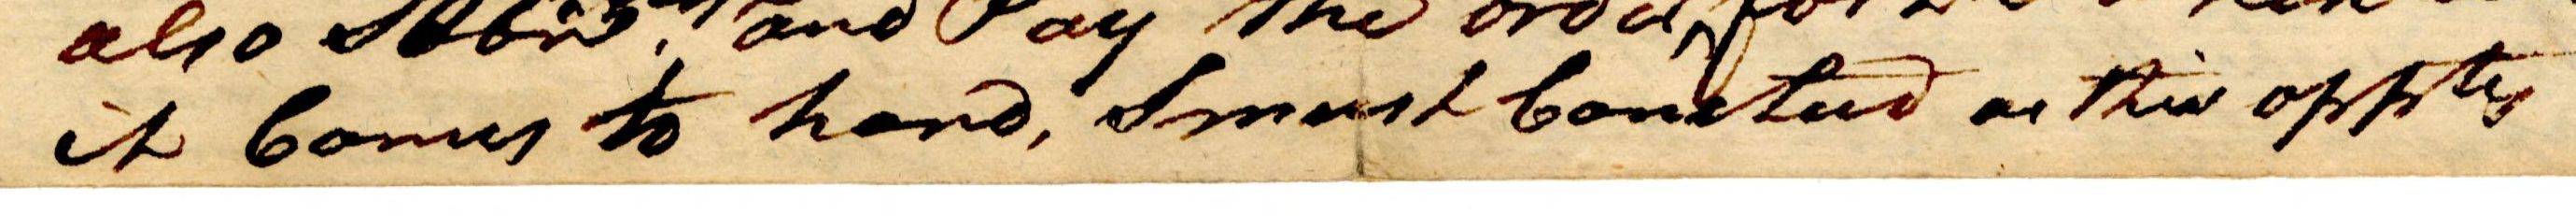it comes to hand,
